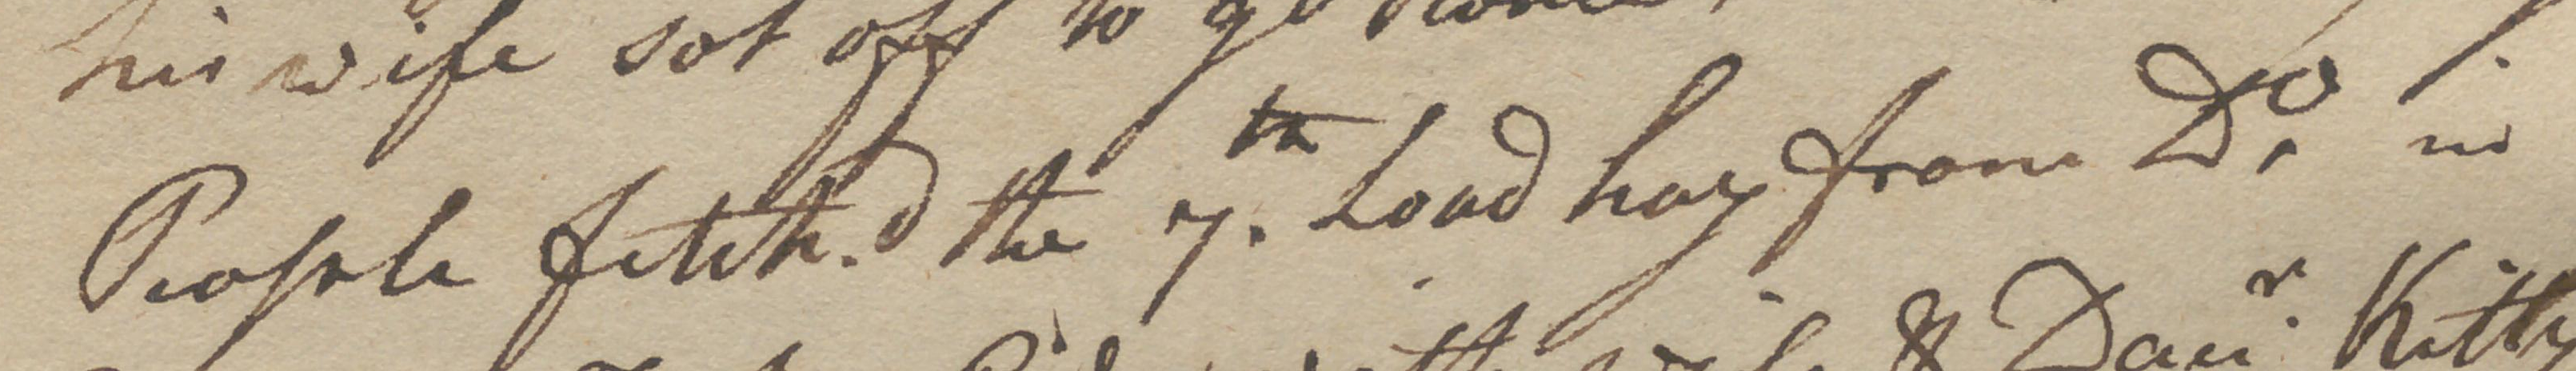People fetch'd the 7^th. Load hay from D^o. in
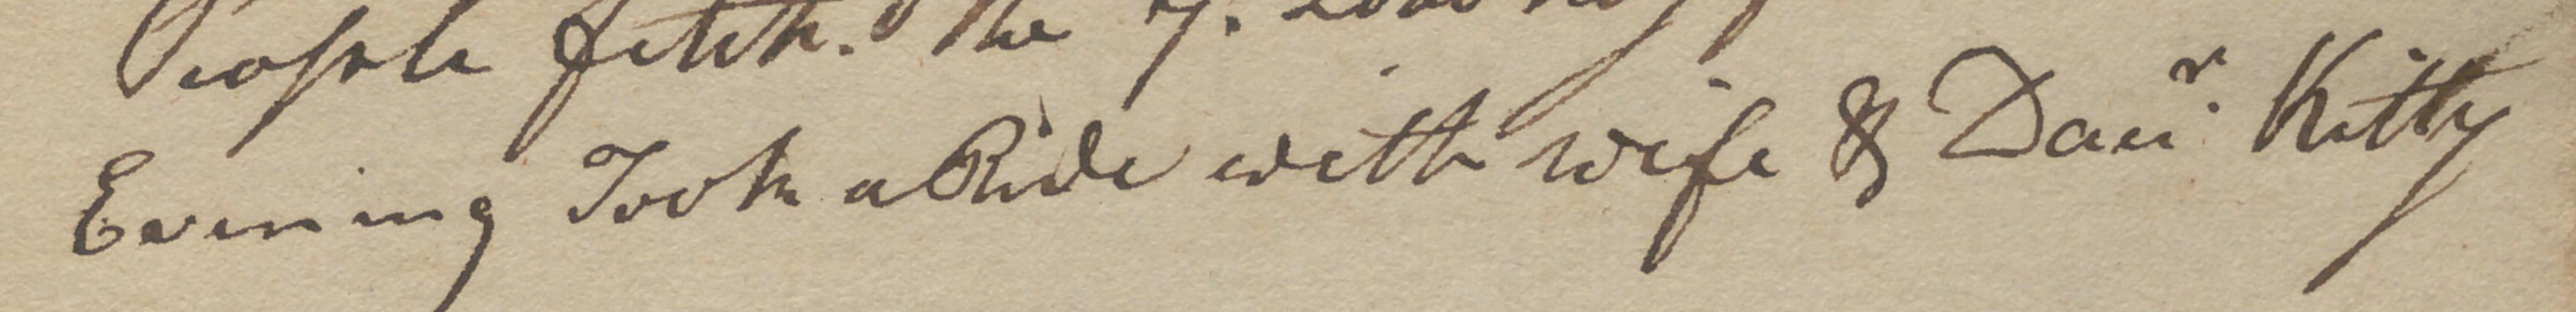Evening Took a Ride with wife & Dau^r. Kitty
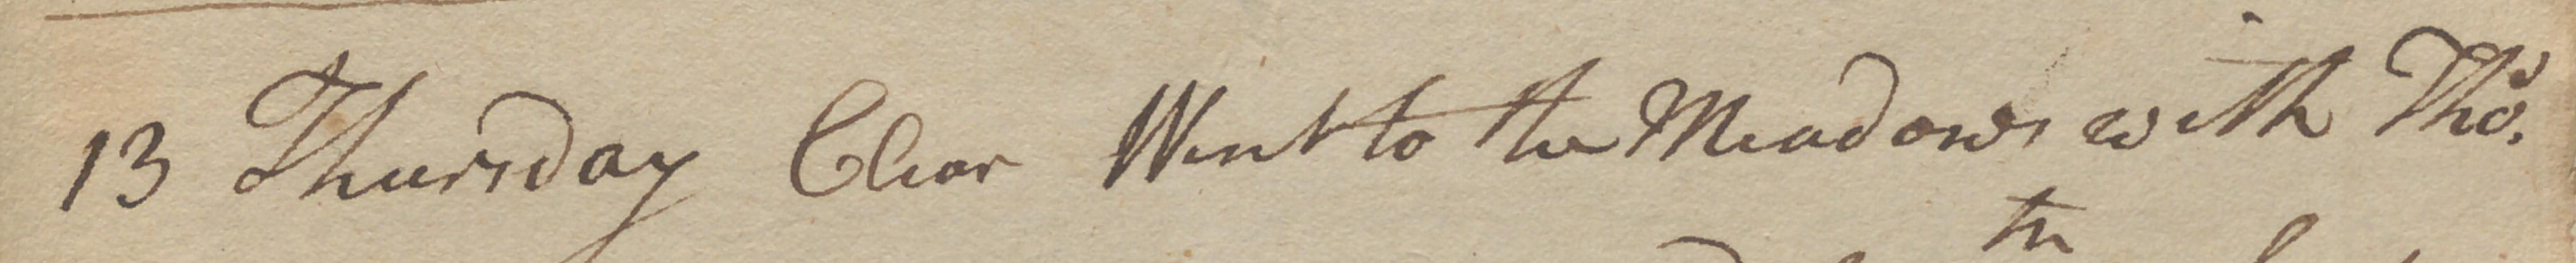13 Thursday Clear Went to the Meadows with Tho^s.
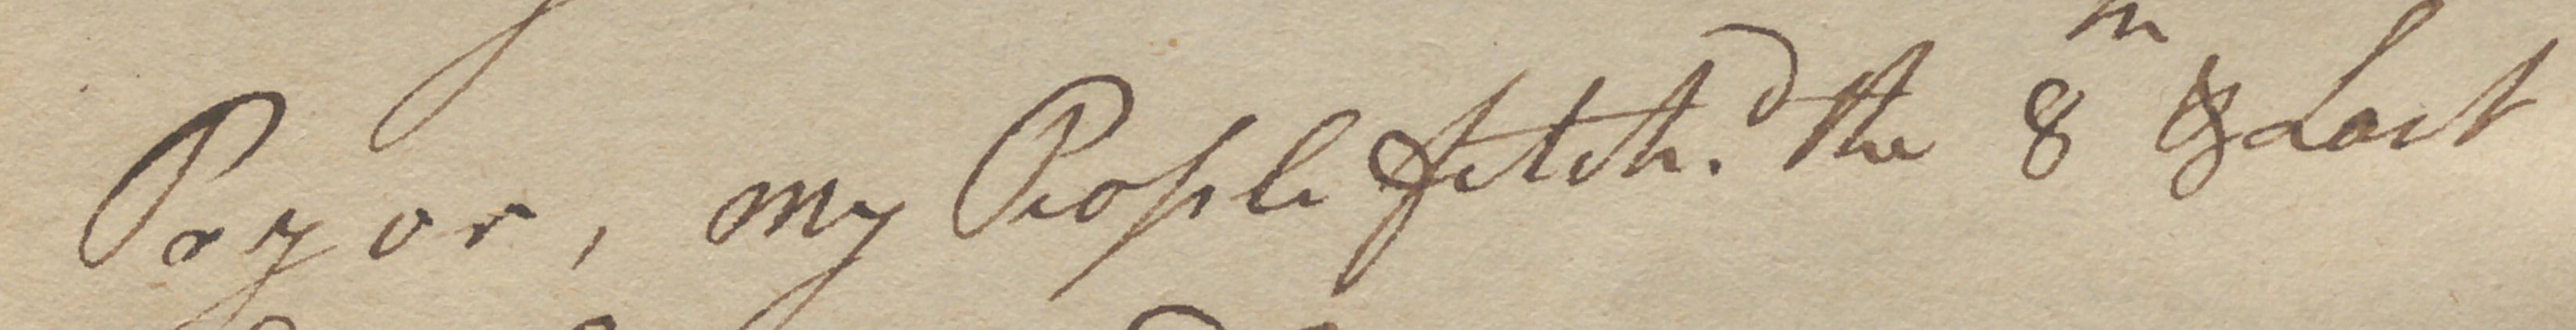Pryor, my People fetch^d. the 8^th & Last
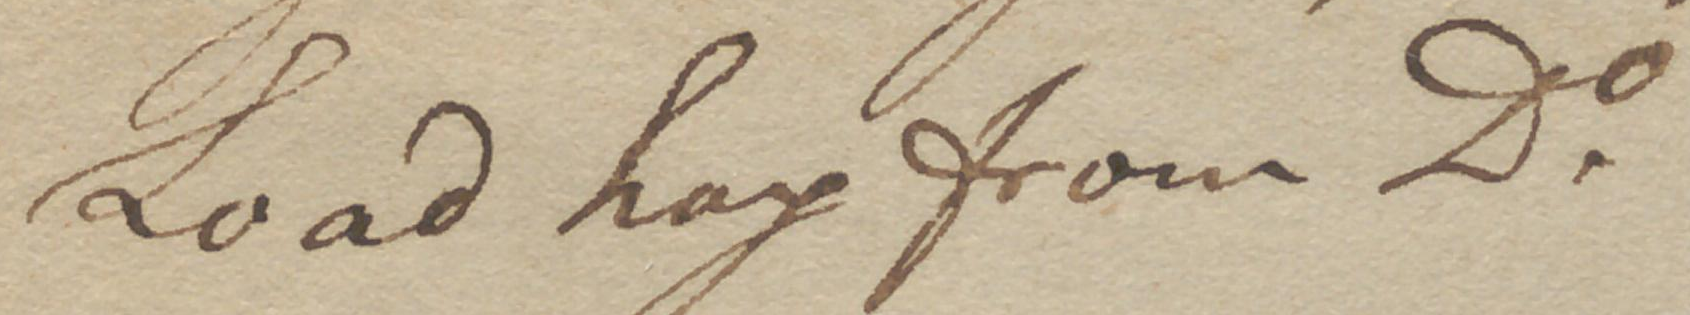Load hay from D^o.
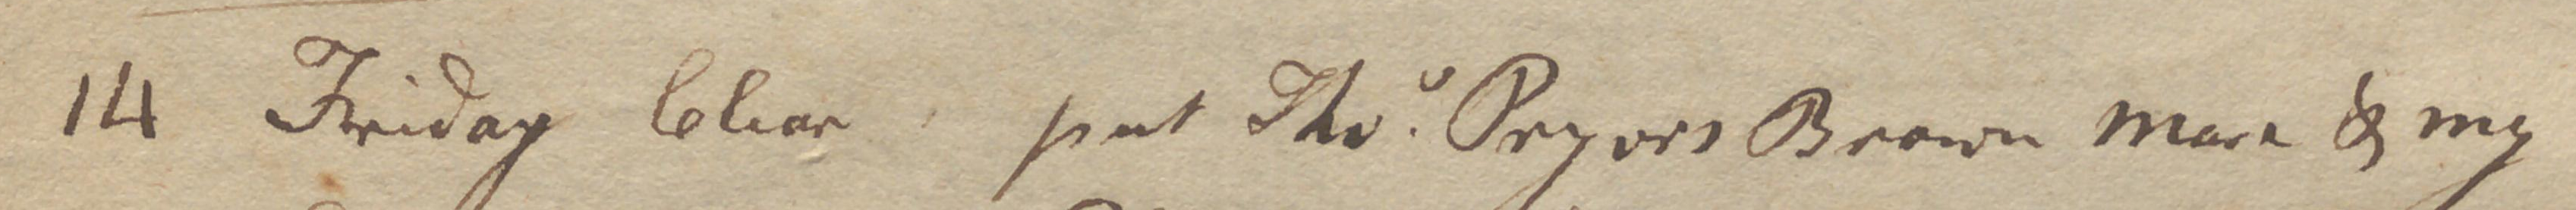14 Friday Clear. put Tho^s. Pryors Brown mare & my
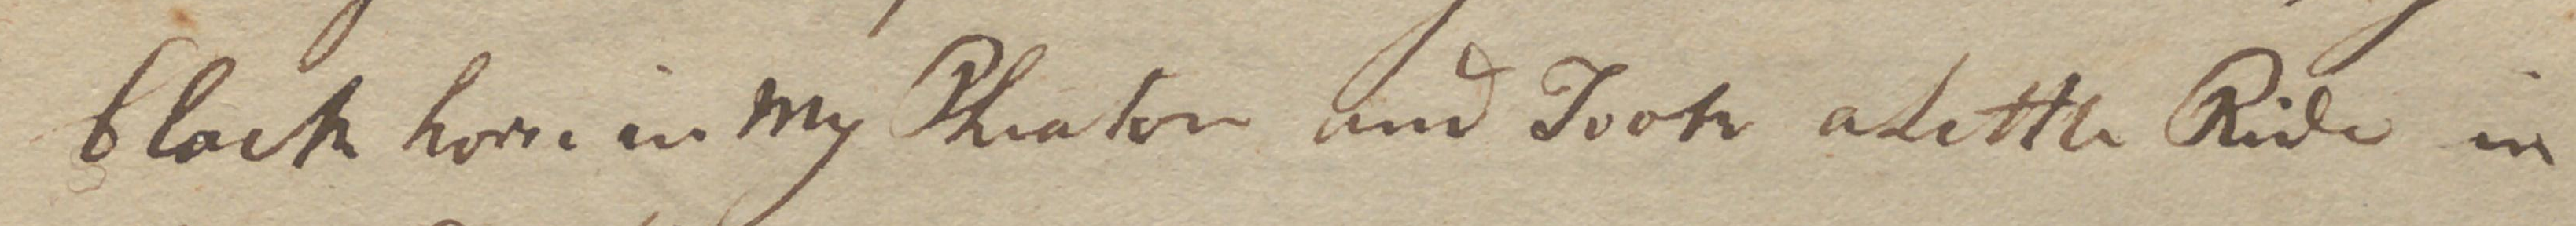black horse in my Pheaton and Took a Little Ride in
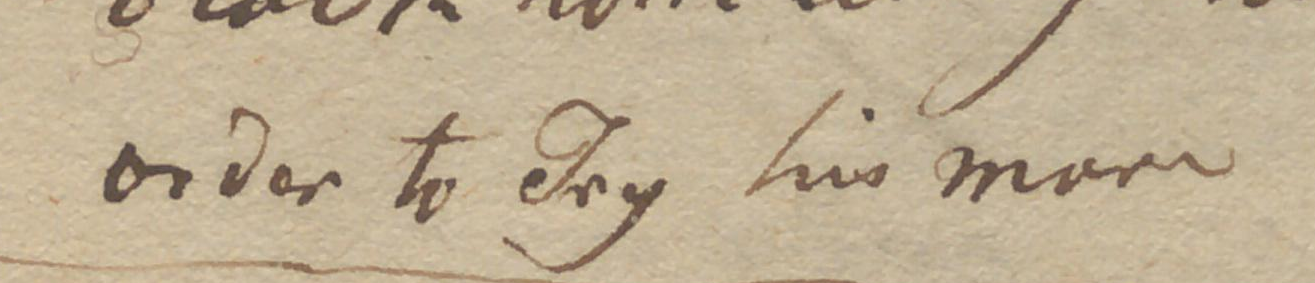order to Try his more
